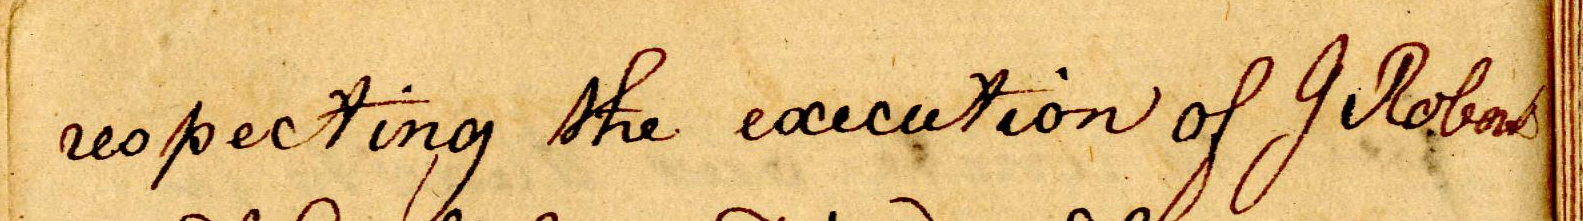respecting the execution of J Robert
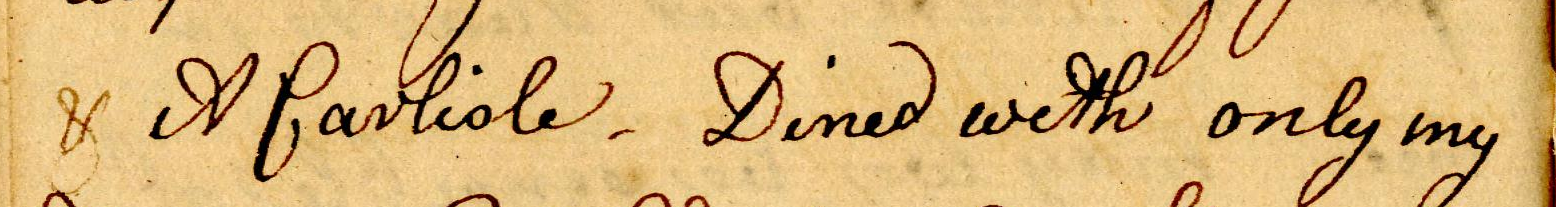& A Carlisle- Dined with only my
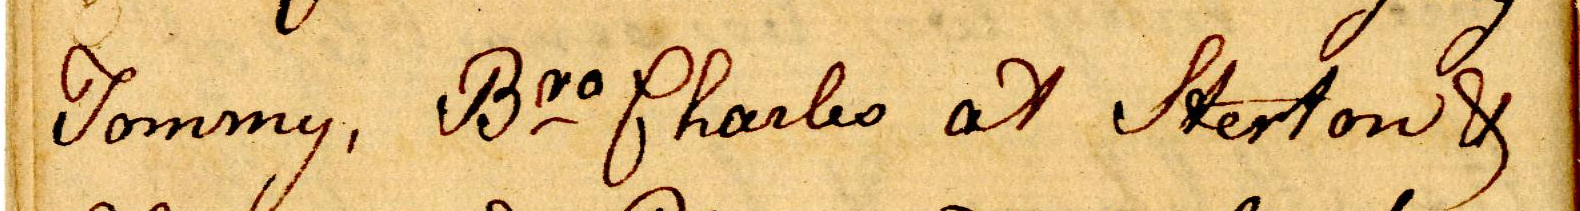Tommy, B^ro Charles at Stenton &
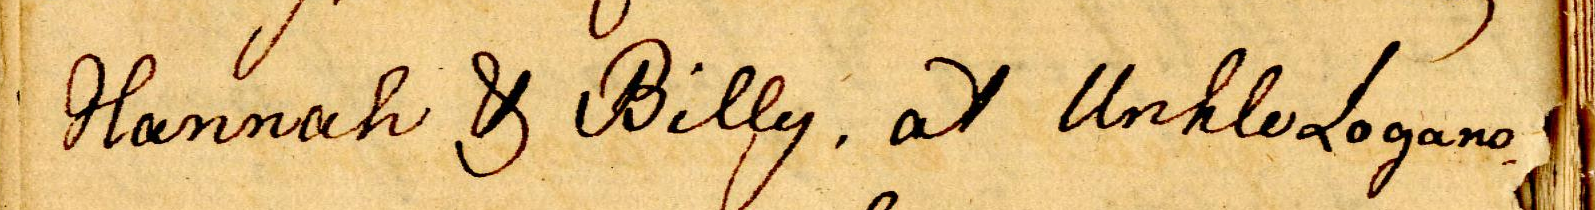Hannah & Billy, at Unkle Logans
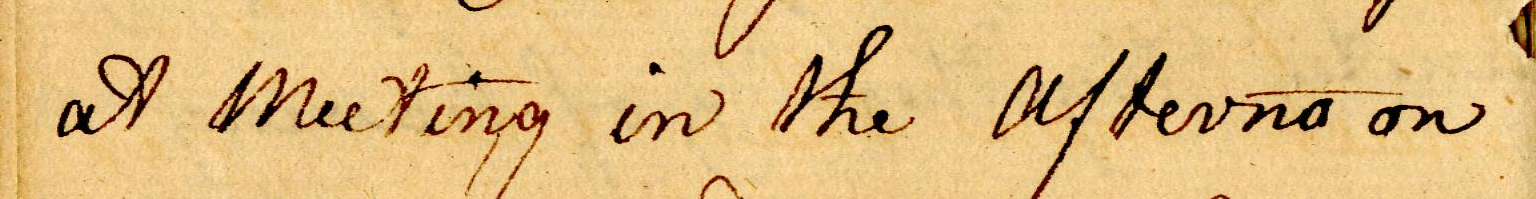at Meeting in the Afternoon
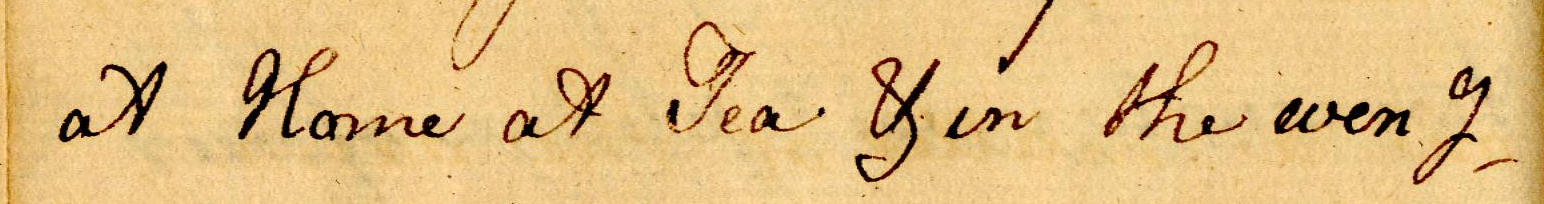at Home at Tea & in the even^g
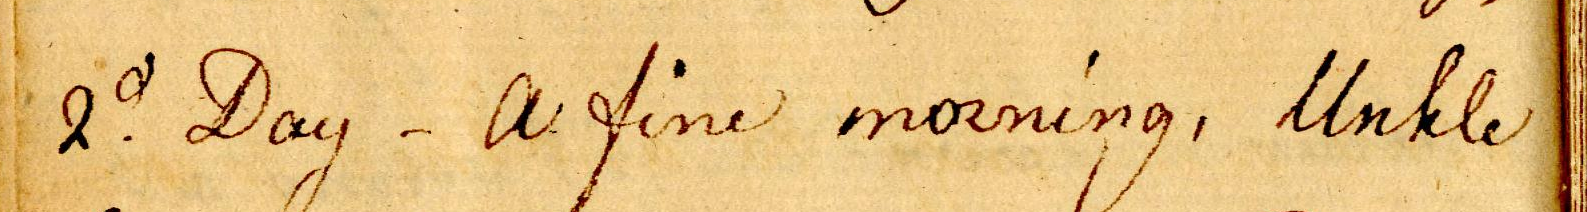2^d. Day- A fine morning, Unkle
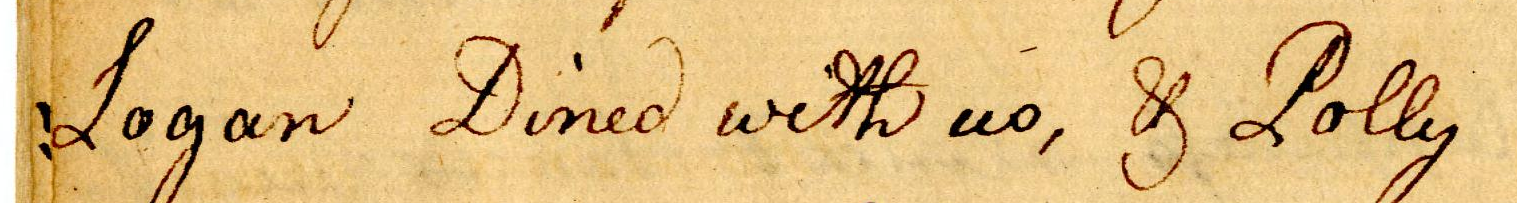Logan Dined with us, & Polly
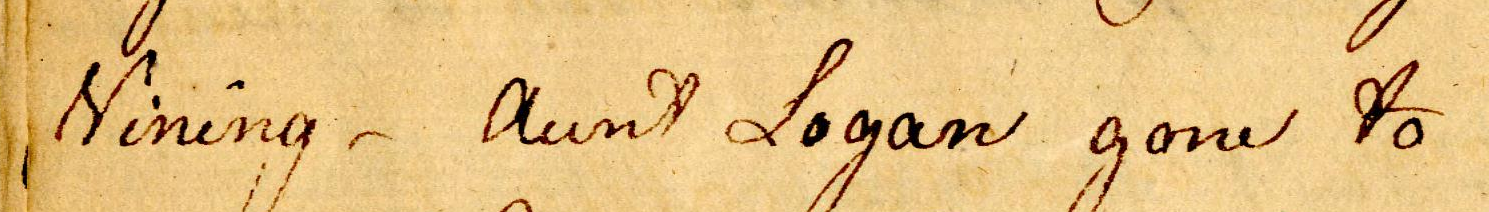Vining- Aunt Logan gone to
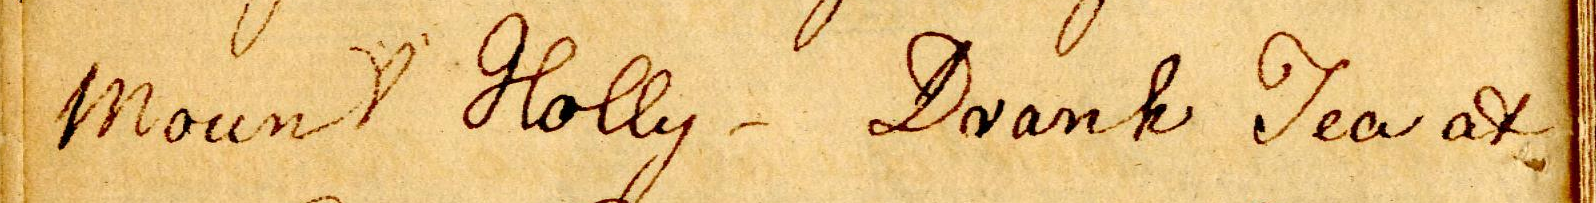Mount Holly- Drank Tea at
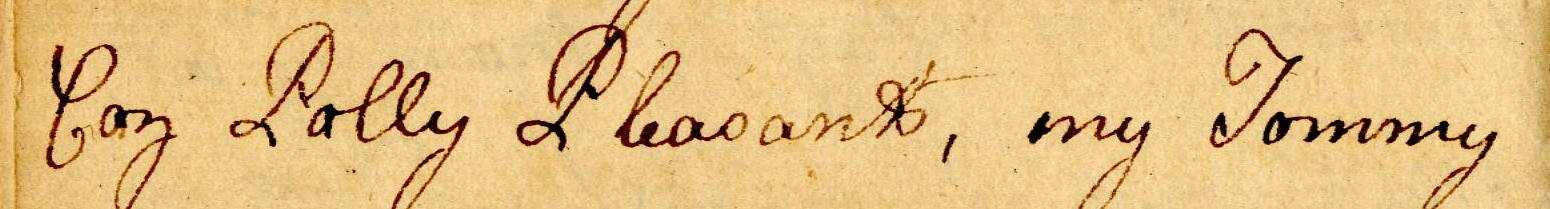Coz Polly Pleasants, my Tommy
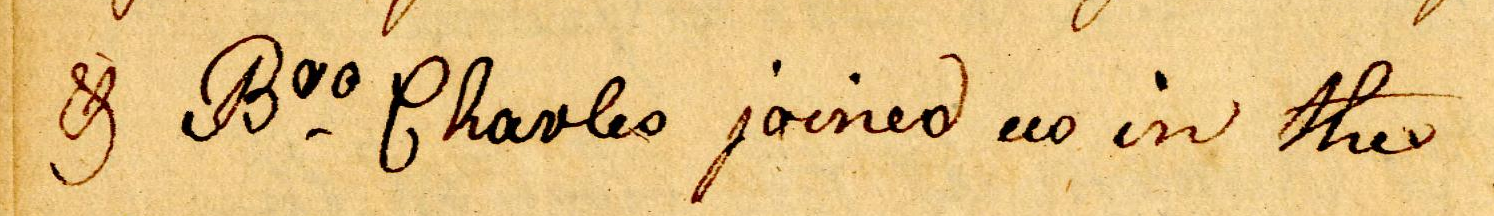& B^ro Charles joined us in the
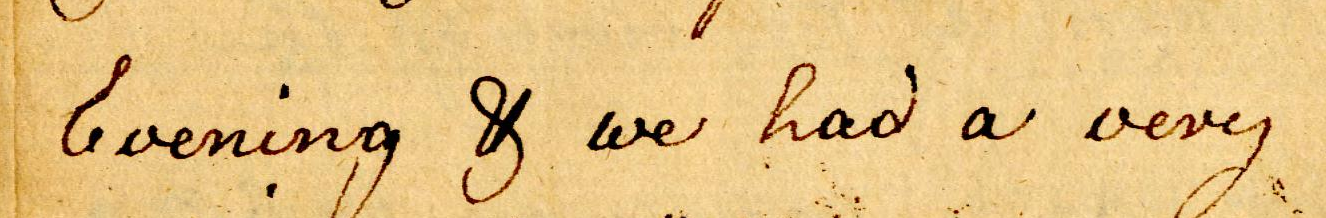Evening & we had a very
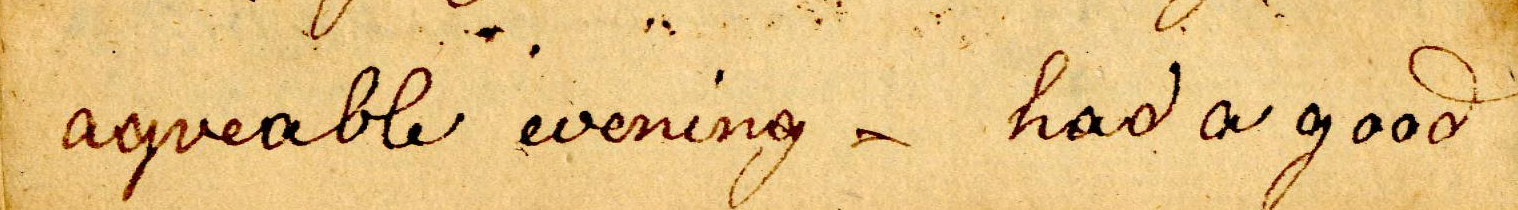agreable evening- had a good
